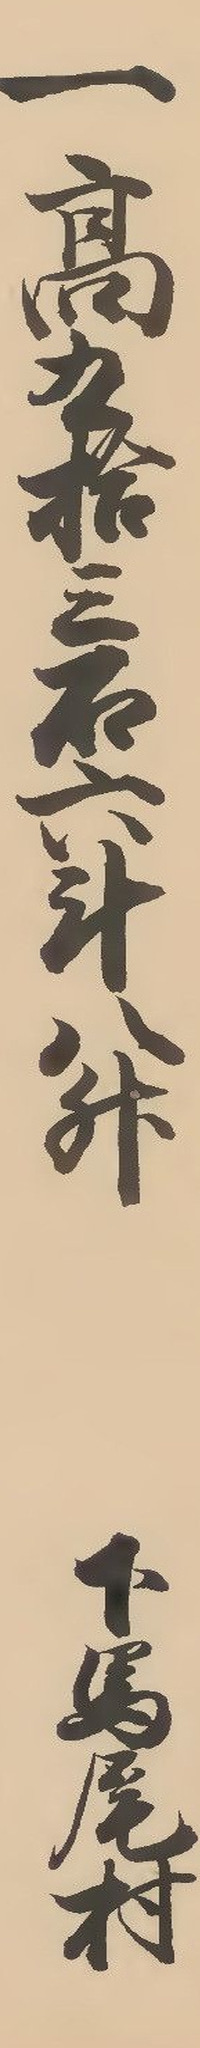一髙九拾三石六斗六升下馬尾村
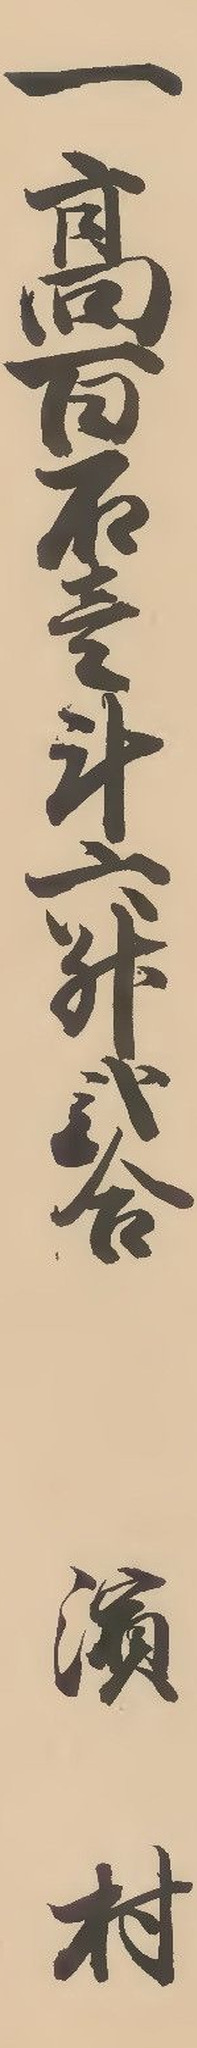一髙百石壱斗六升弐合濱村
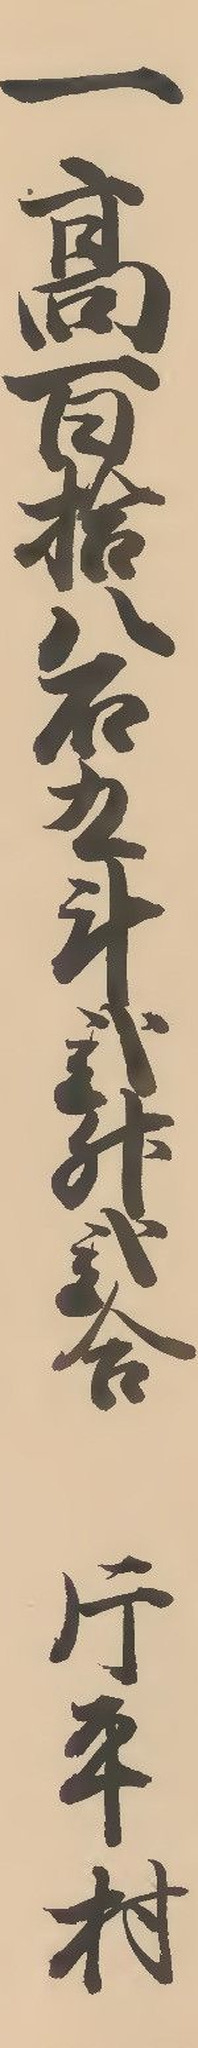一髙百拾八石九斗弐升弐合片平村
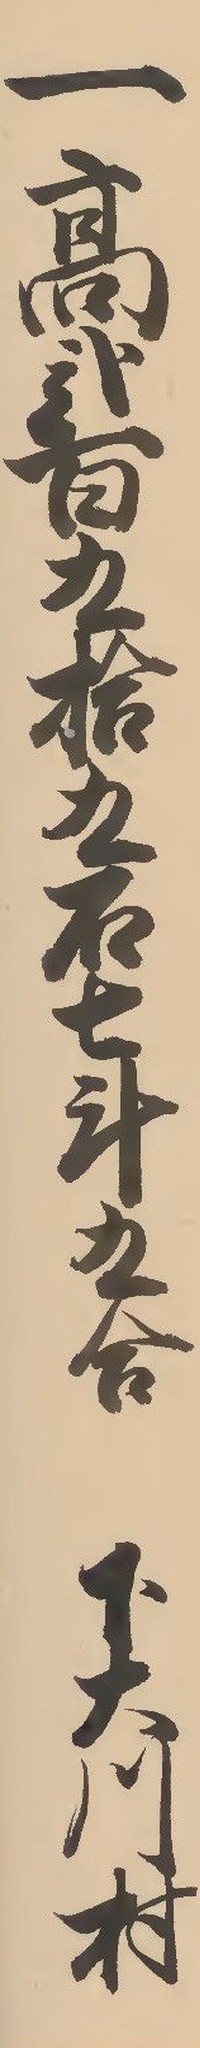一髙弐百九拾九石七斗九升下大川村
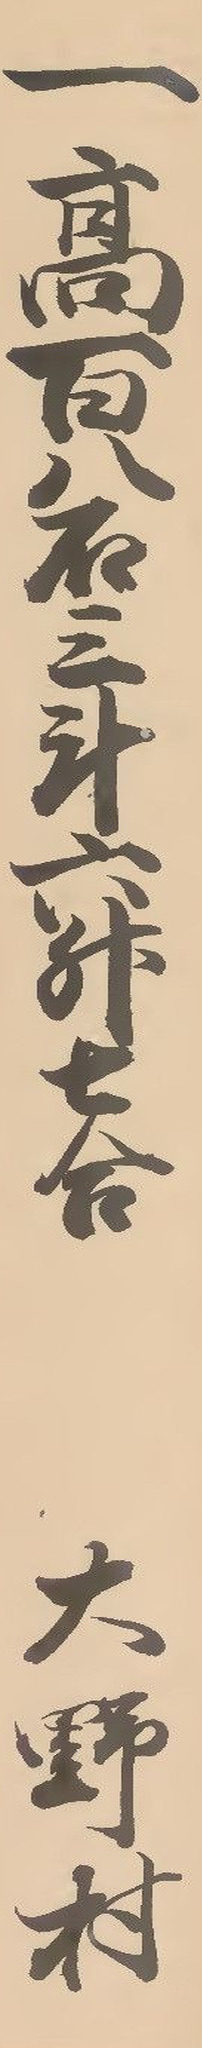一髙百八石三斗六升七合大野村
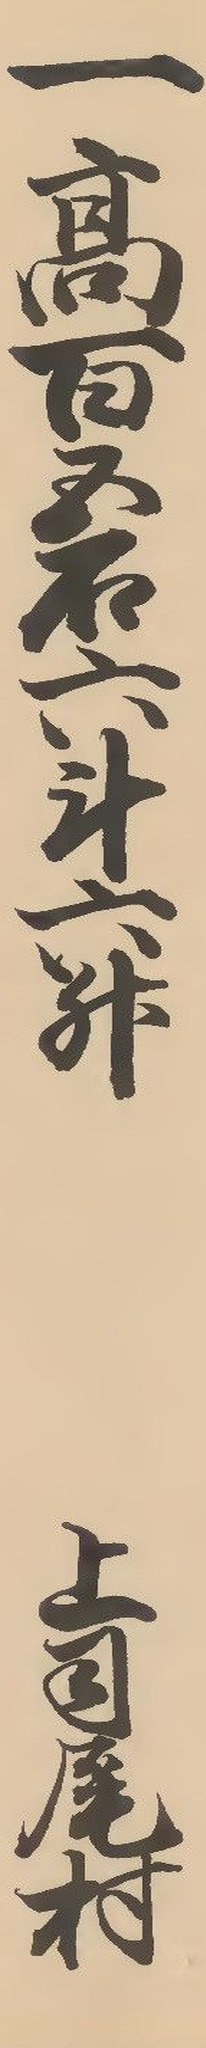一髙百五石六斗六升上司尾村
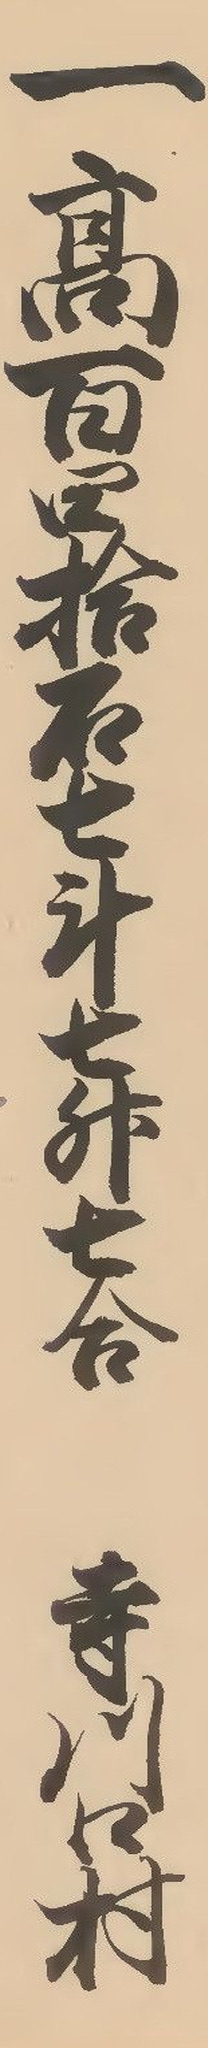一髙百四拾石七斗七升七合寺川口村
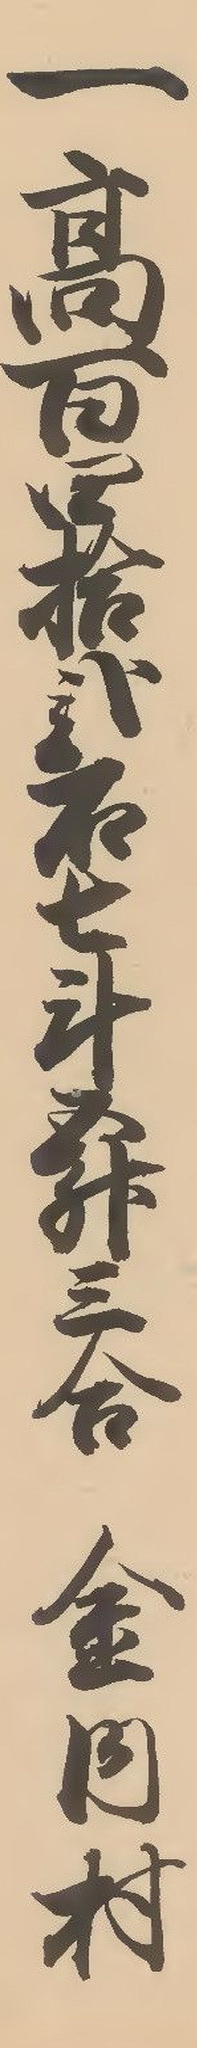一髙百四拾弐石七斗五升三合金内村

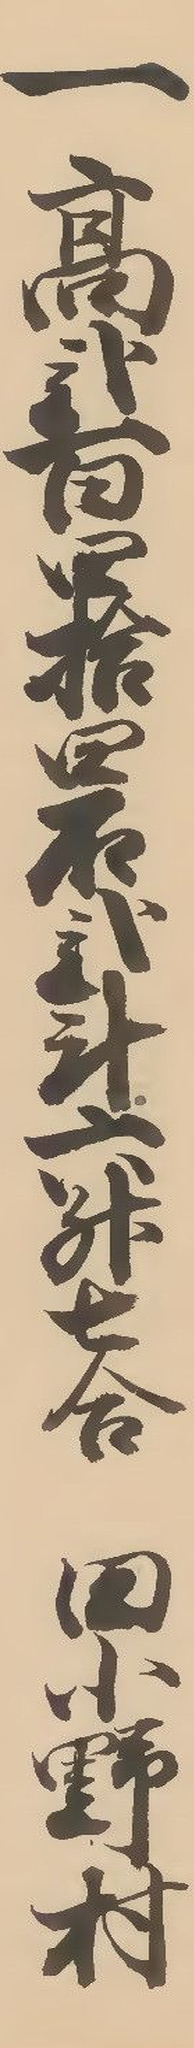一髙弐百四拾四石弐斗六升七合田小野村
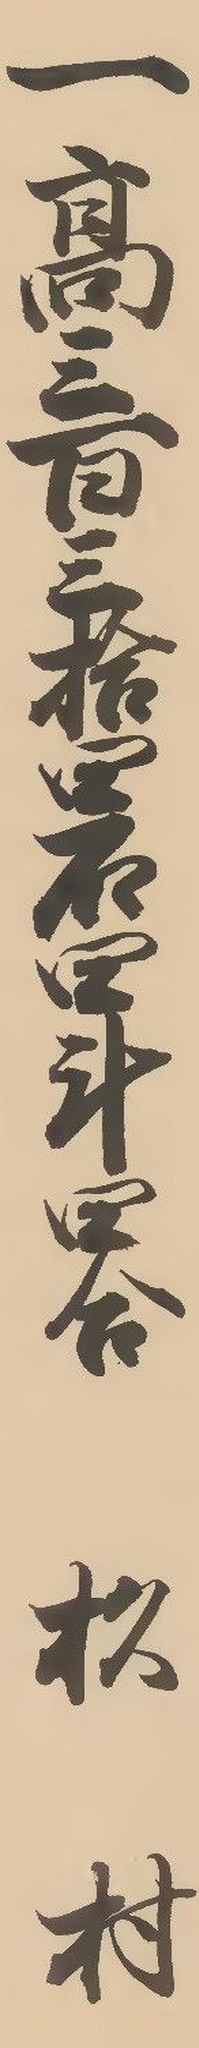一髙三百三拾四石四斗四合杦村
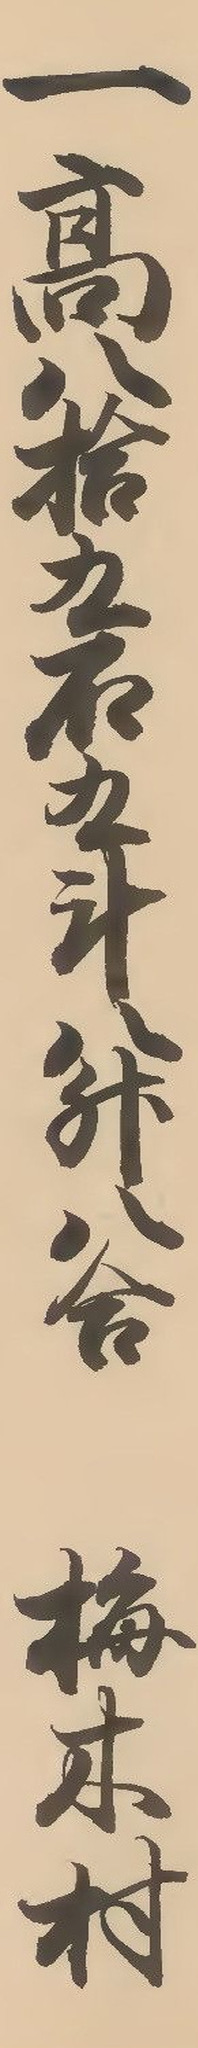一髙八拾九石九斗八升八合梅木村
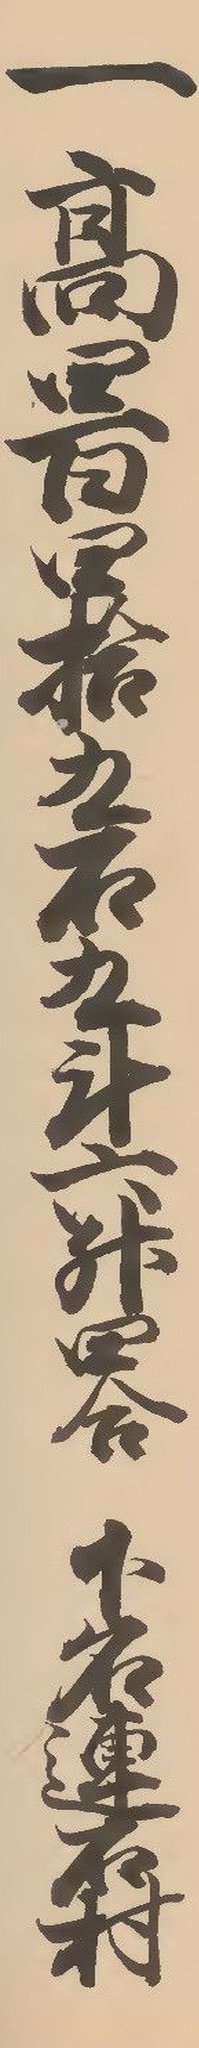一髙四百四拾九石九斗六升四合下名連石村
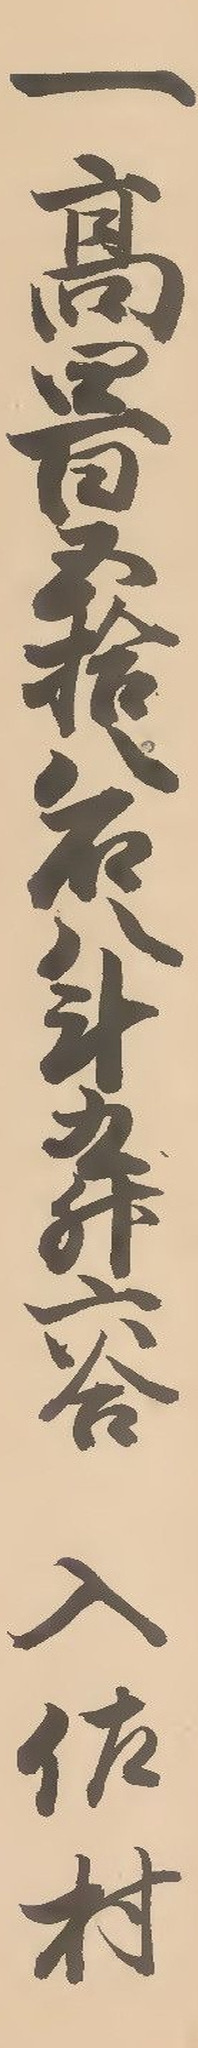一髙四百五拾八石八斗九升六合入佐村
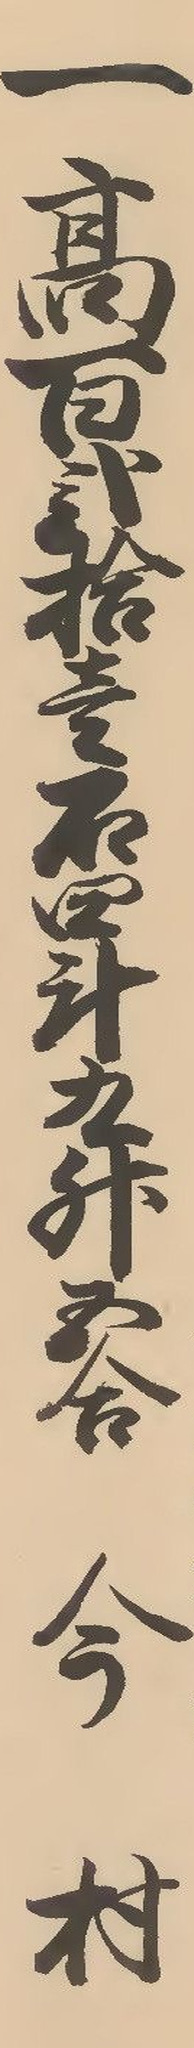一髙百弐拾壱石四斗九升五合今村
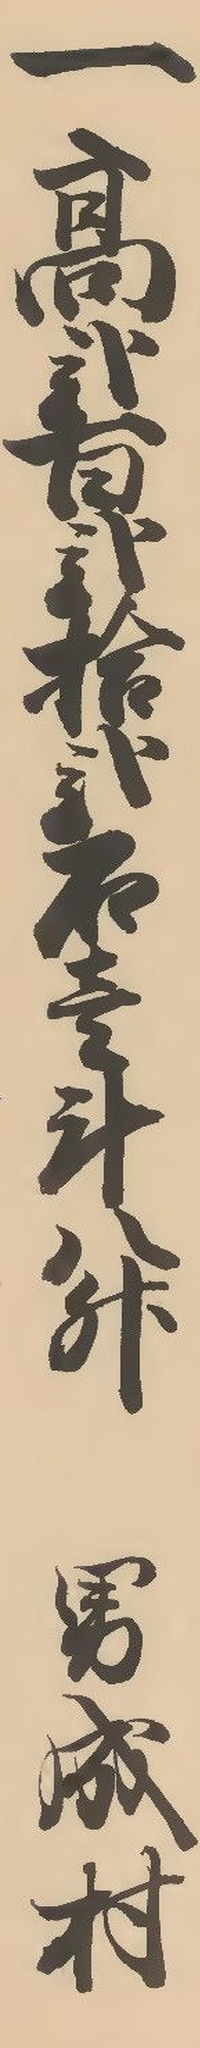一髙弐百弐拾弐石壱斗八升男成村
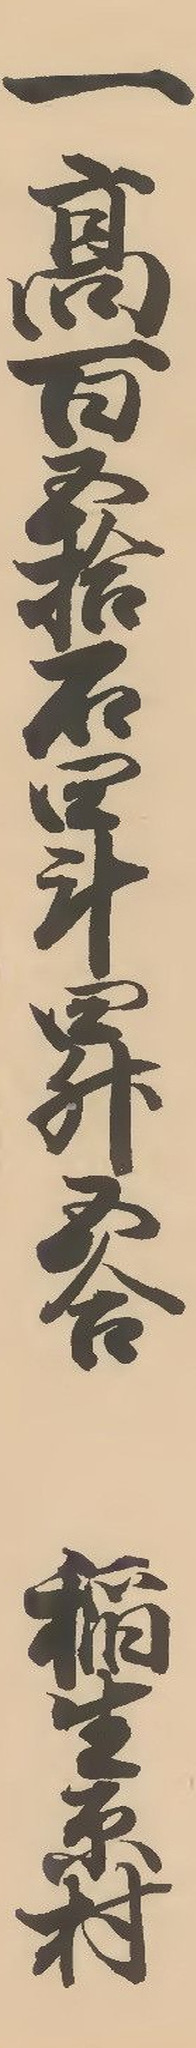一髙百五拾石四斗四升五合稲生原村
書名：肥後国郷帳
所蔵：国立公文書館 National Archives of Japan
